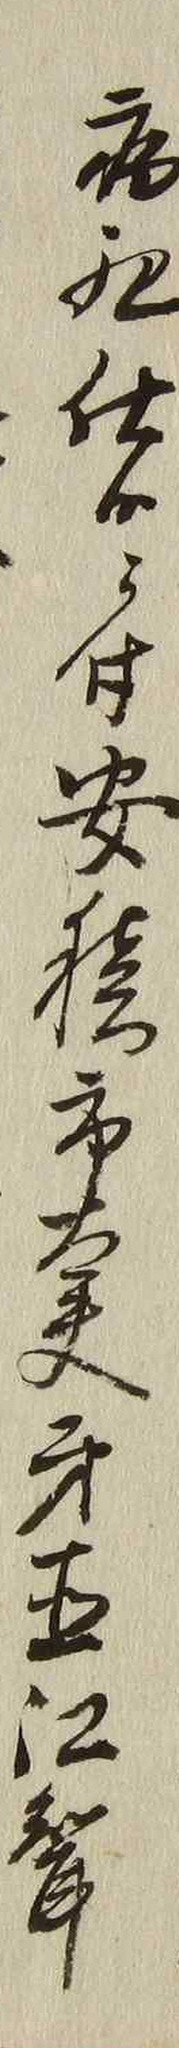病死仕候ニ付安積市太夫弟直江婿
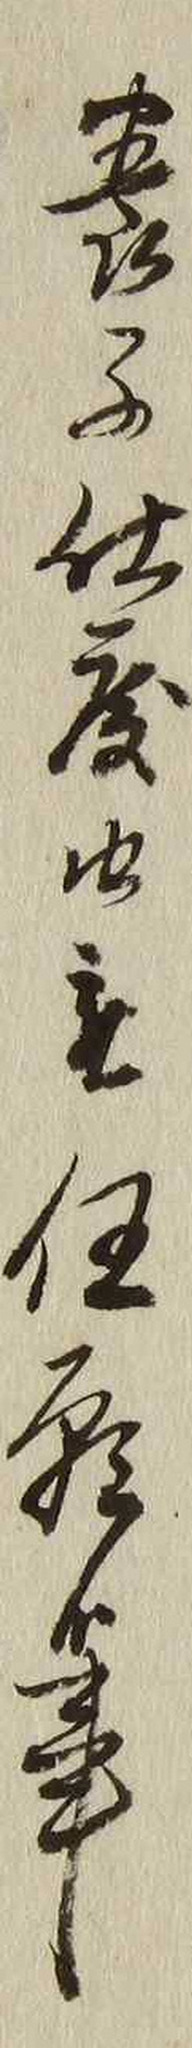養子仕度由被任願候事
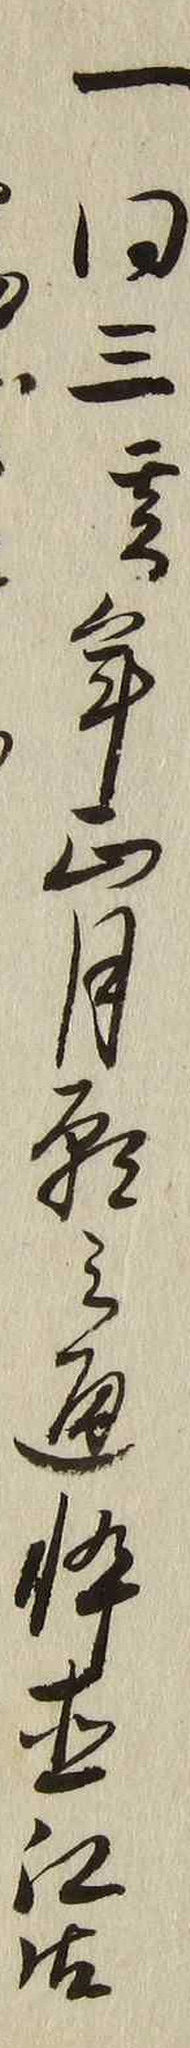一同三亥年正月願之通忰直江御
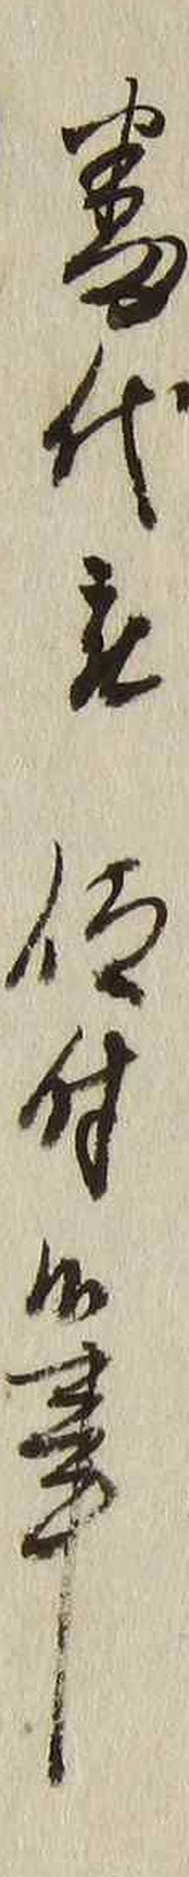番代被仰付候事
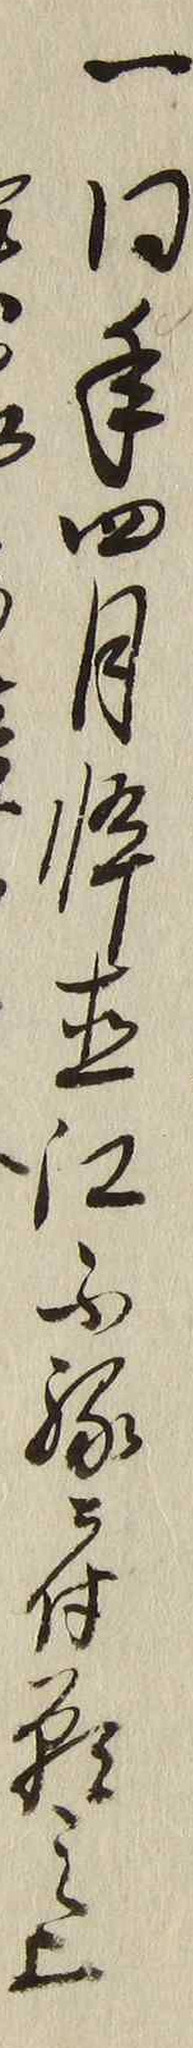一同年四月忰直江不縁ニ付願之上
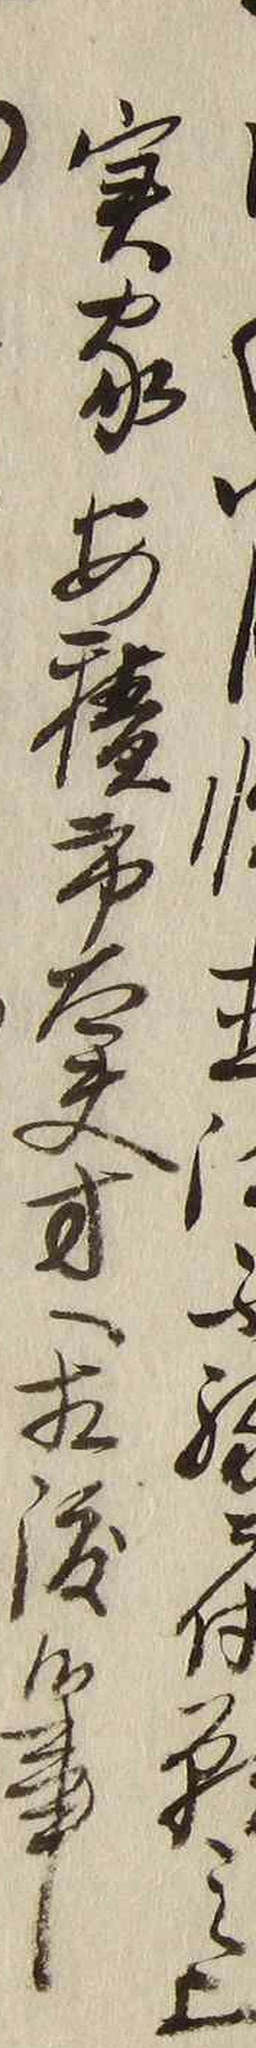実家安積市太夫方へ相渡候事
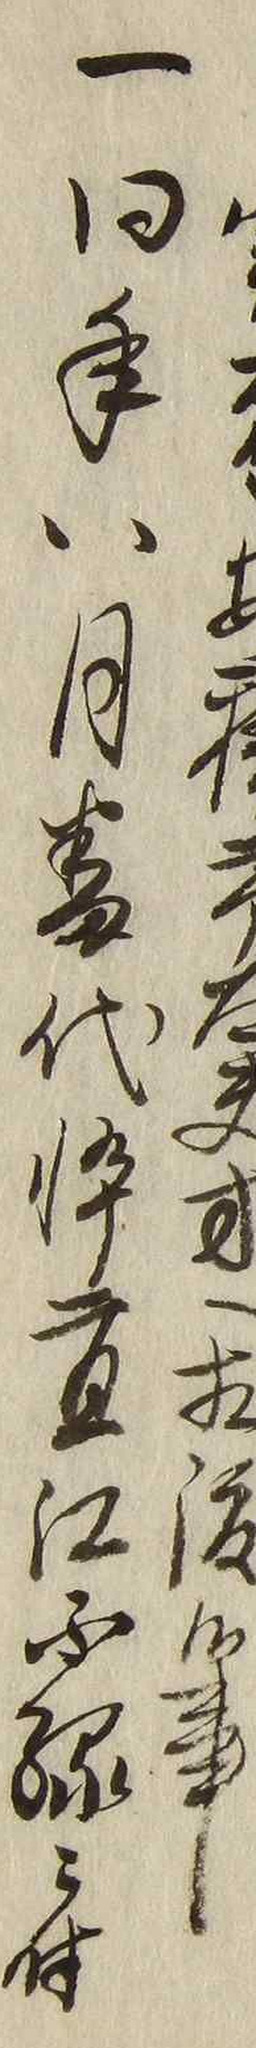一同年八月番代忰直江不縁ニ付

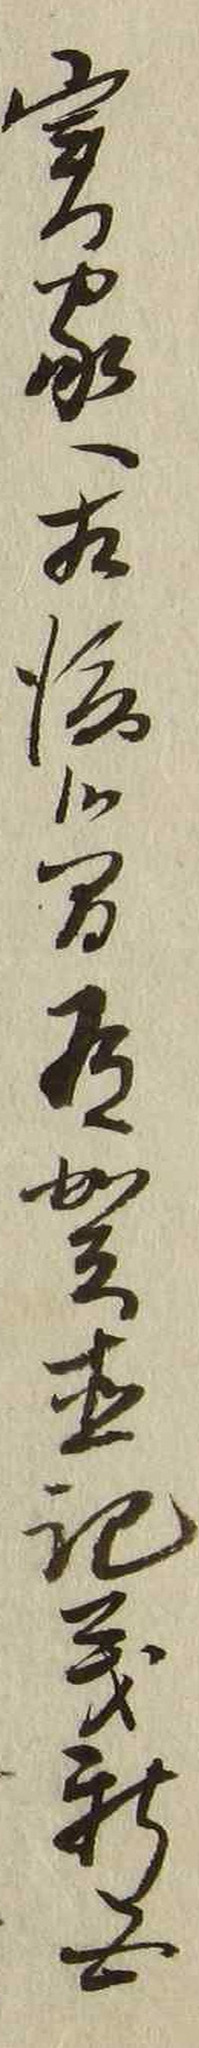実家へ相渡候間有賀直記義新五
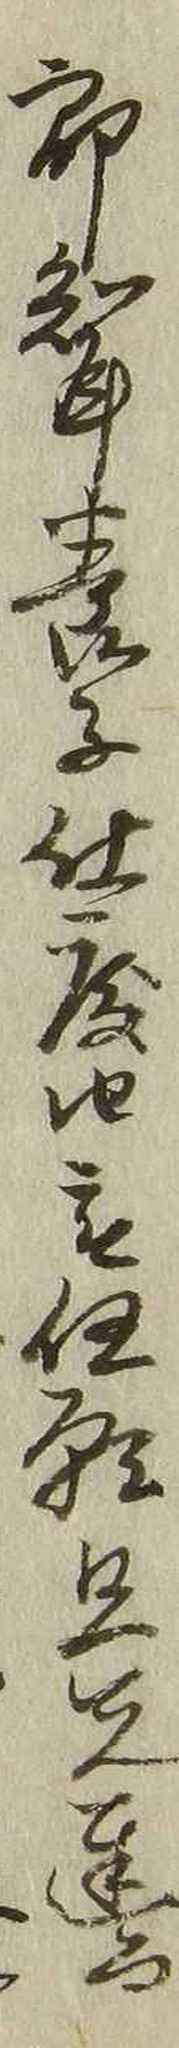郎婿養子仕度由被任願且先達而
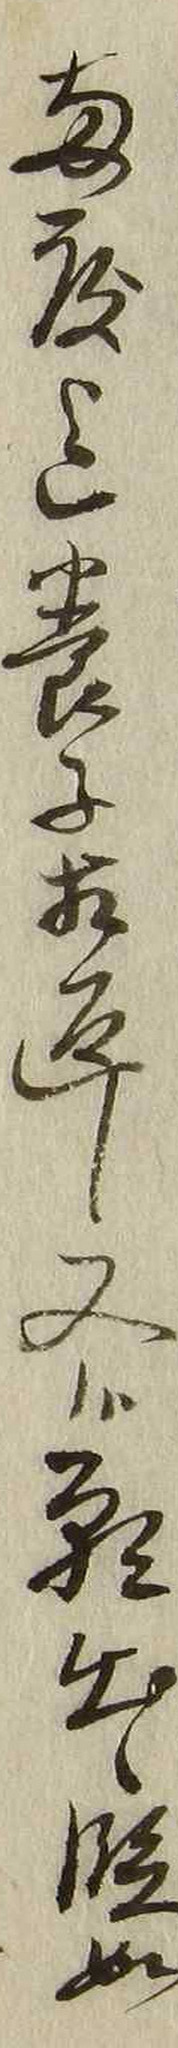両度迄養子相返し又候願出候段如
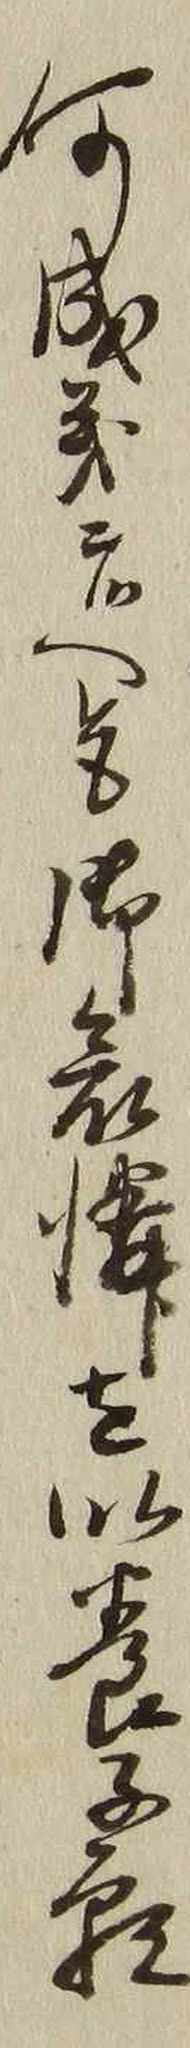何成義ニ候へも御哀憐を以養子願
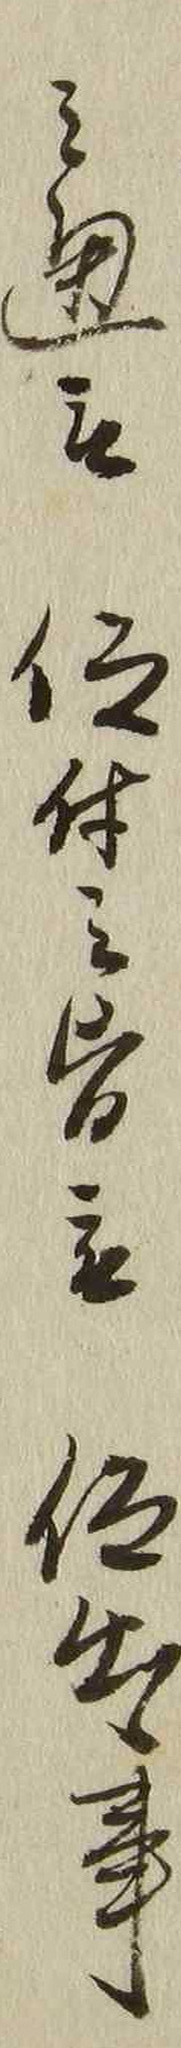之通被仰付之旨被仰出候事
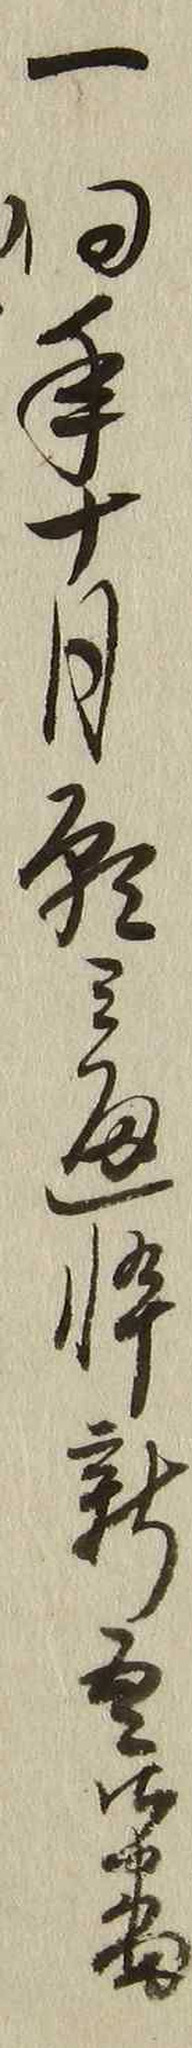一同年十月願之通忰新吾御番
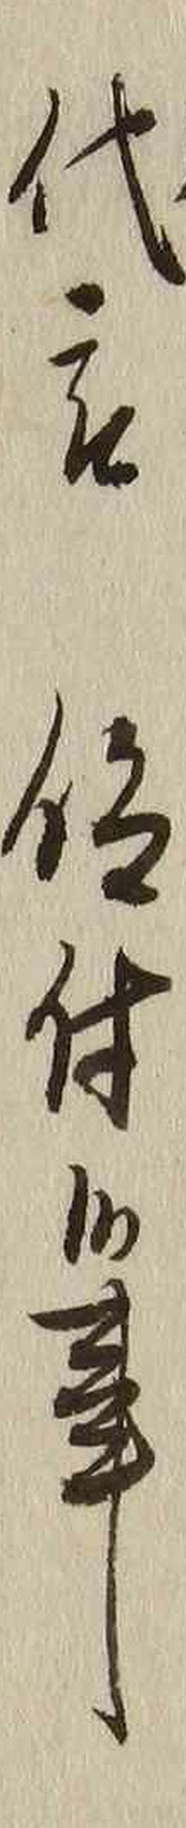代被仰付候事
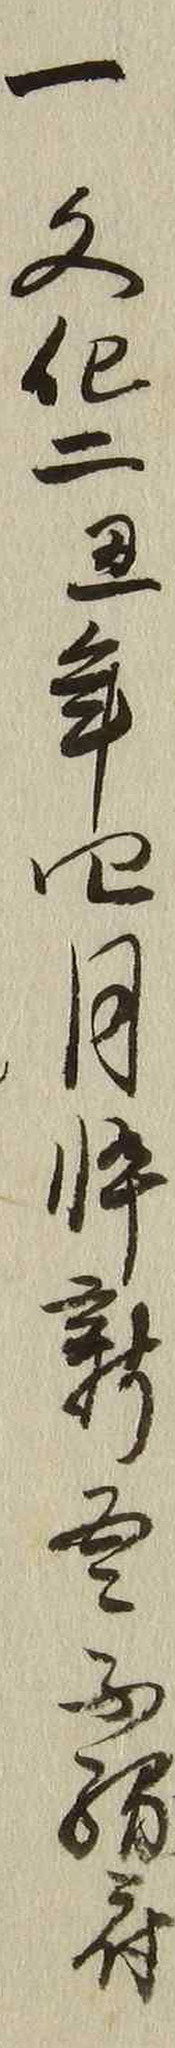一文化二丑年四月忰新吾不縁ニ付
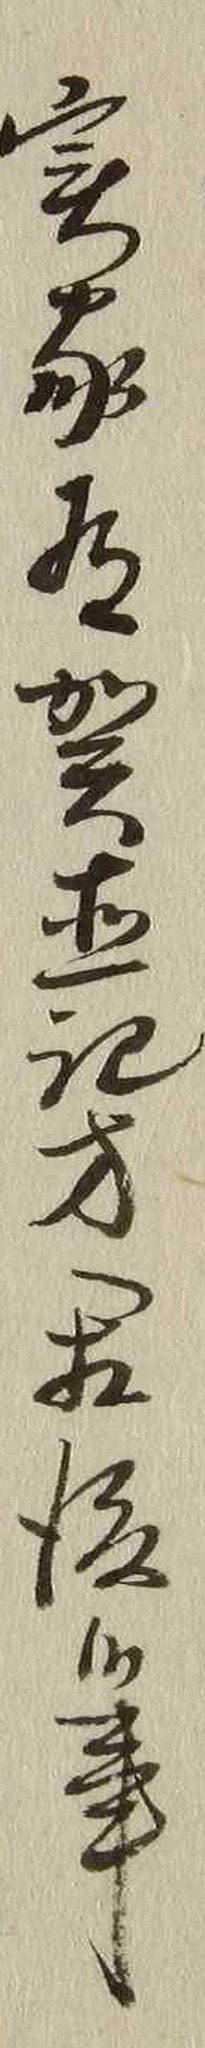実家有賀直記方へ相渡候事
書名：諸士系譜　巻之348　も之部4
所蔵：会津若松市立会津図書館
